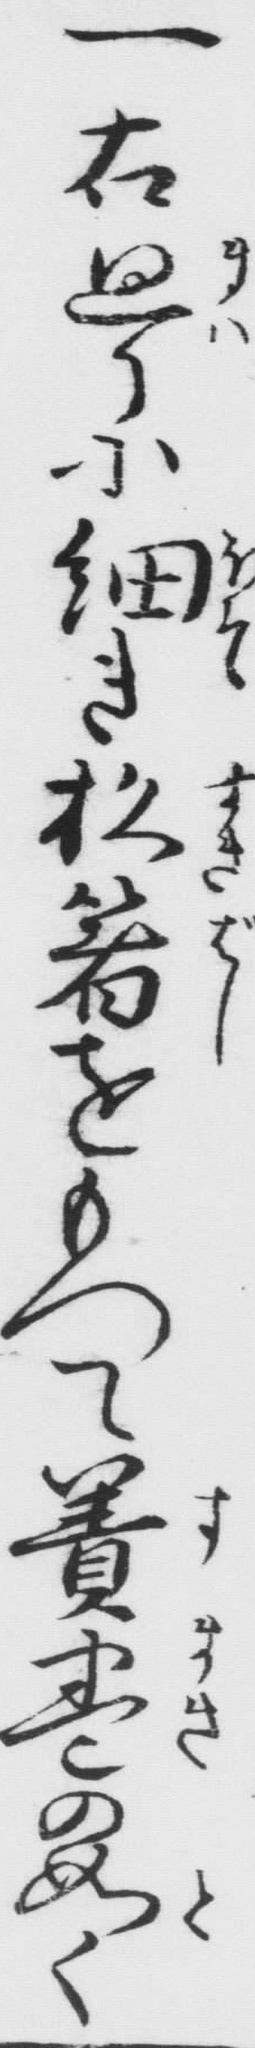一右廻りに細き杉箸をもつて簀巻の如く
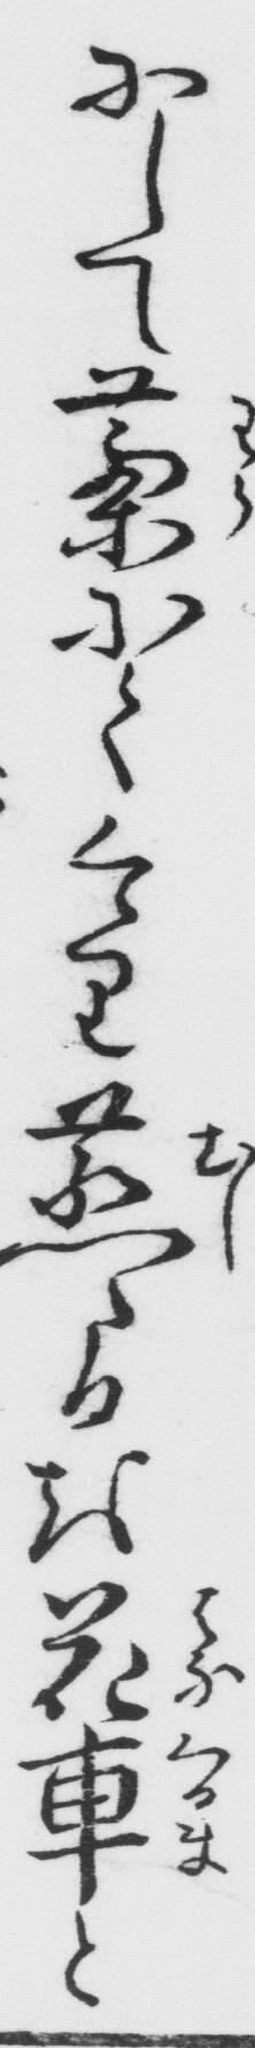にして藁にてくゝり蒸たるを花車と
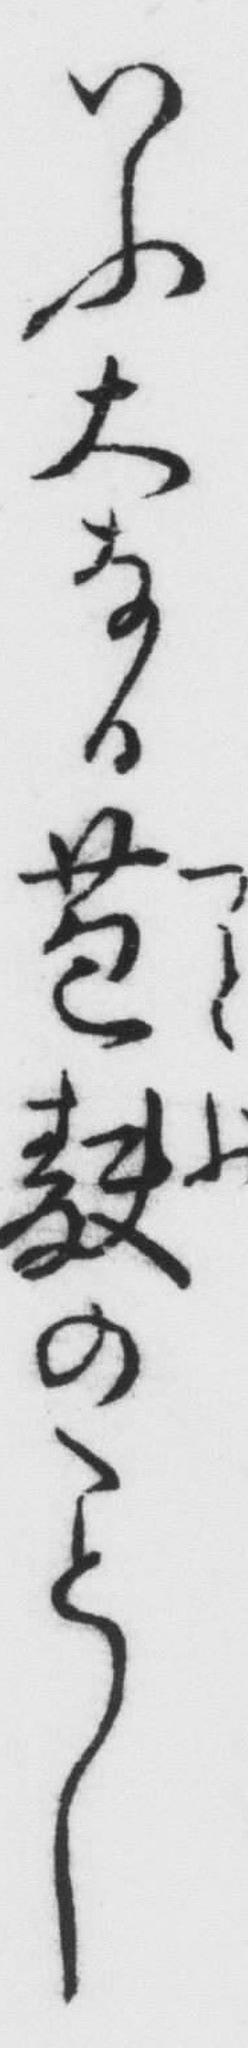いふ大なる苞麩のことし
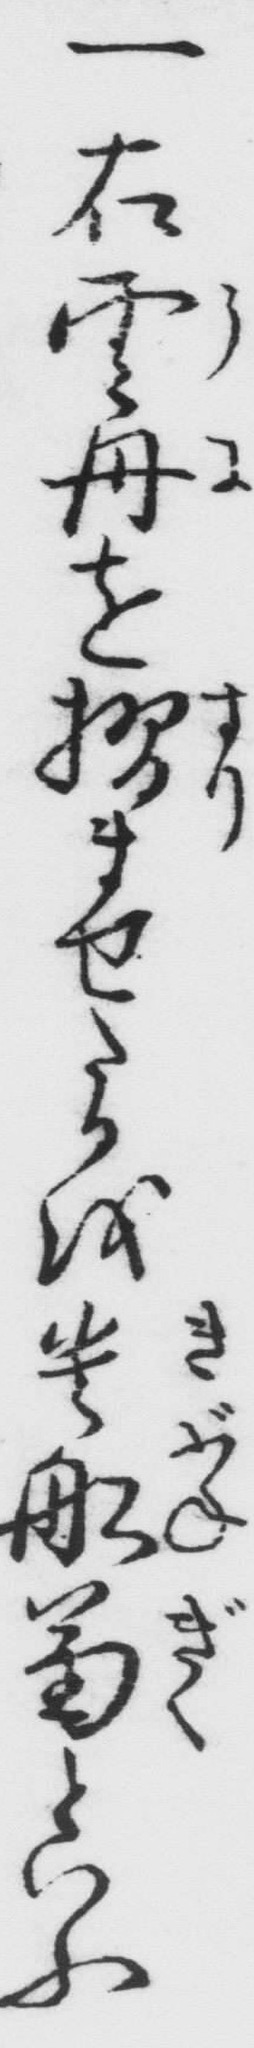一右雲丹を摺ませたるを貴船菊といふ
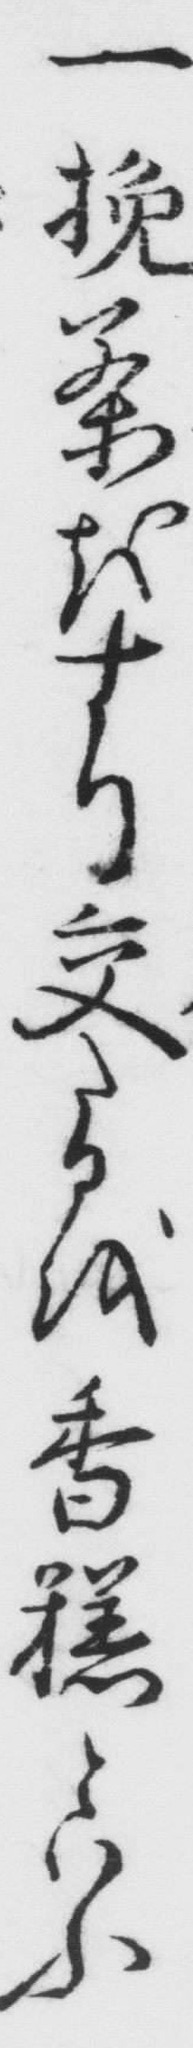一挽茶をすり交たるを香糕といふ
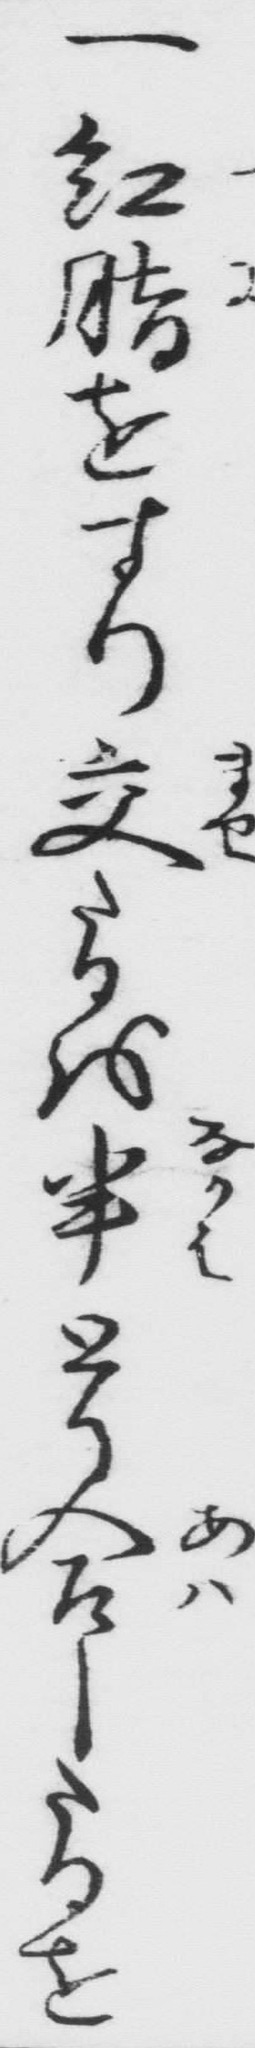一紅脂をすり交たるを半とり合したるを

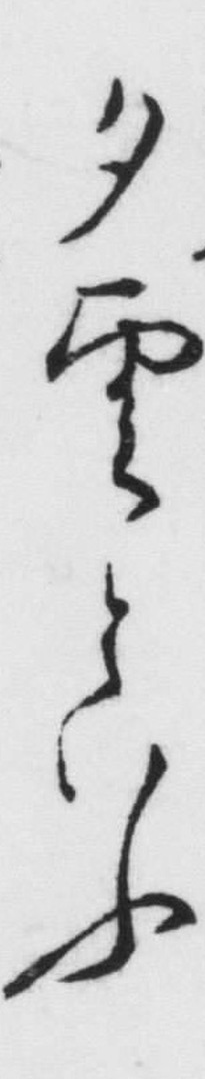夕雲といふ
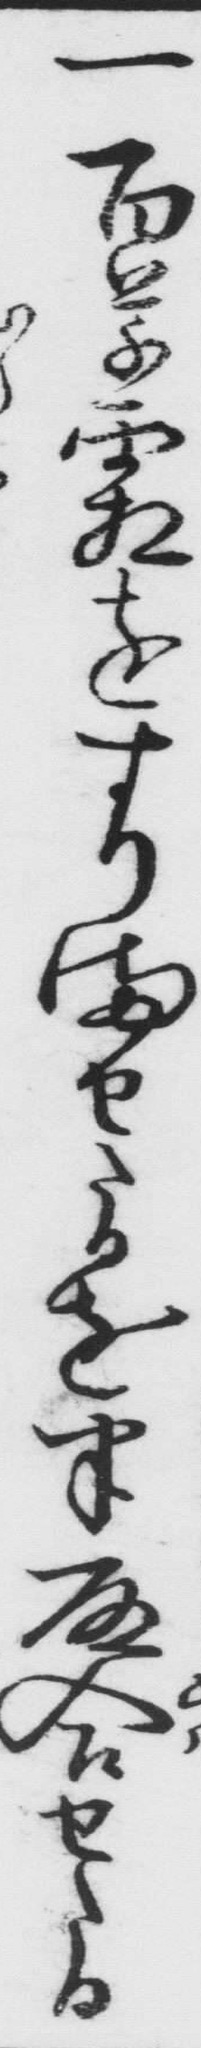一百草霜をすりませたるを半取合せたる
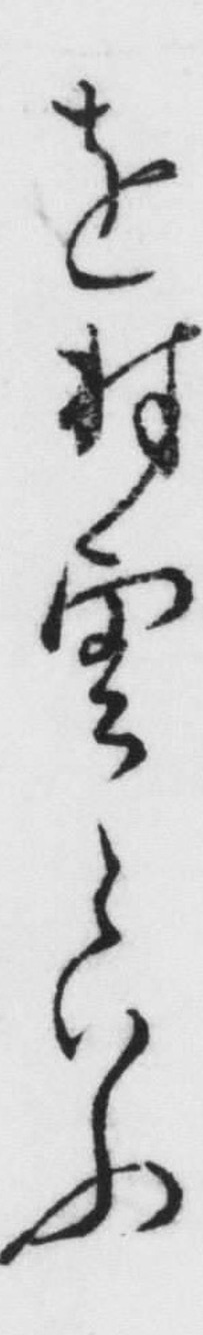を村雲といふ
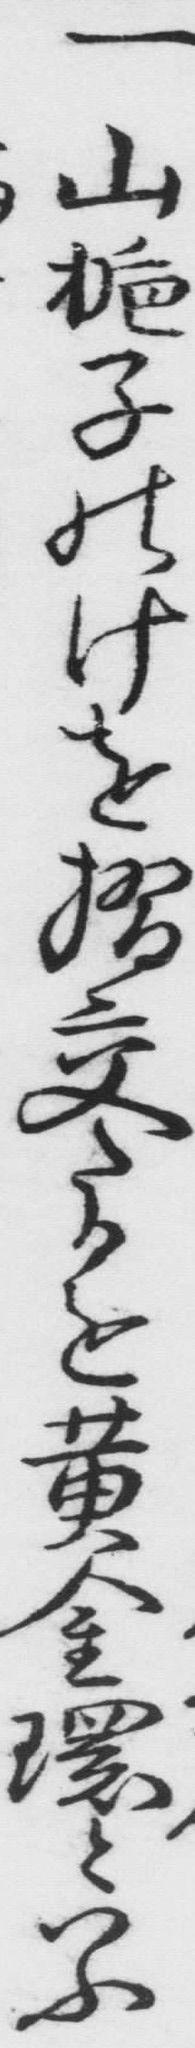一山梔子の汁を摺交たるを黄金環といふ
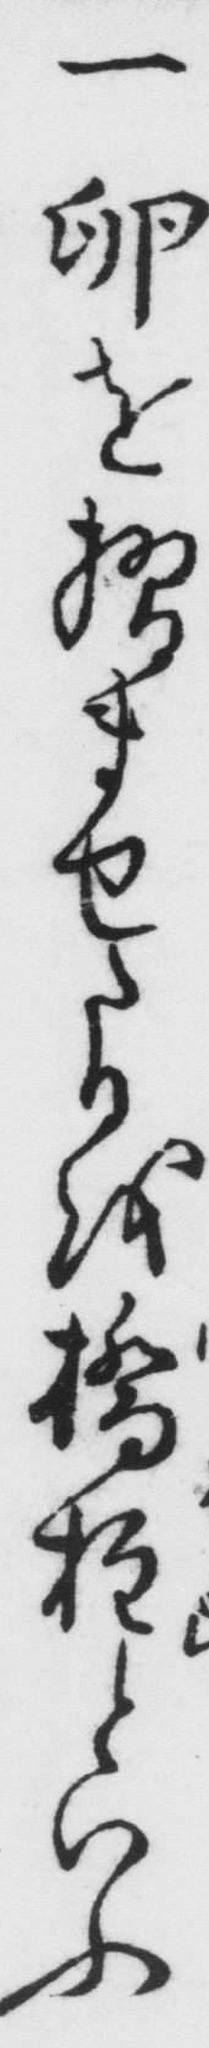一卵を摺ませたるを橋柱といふ
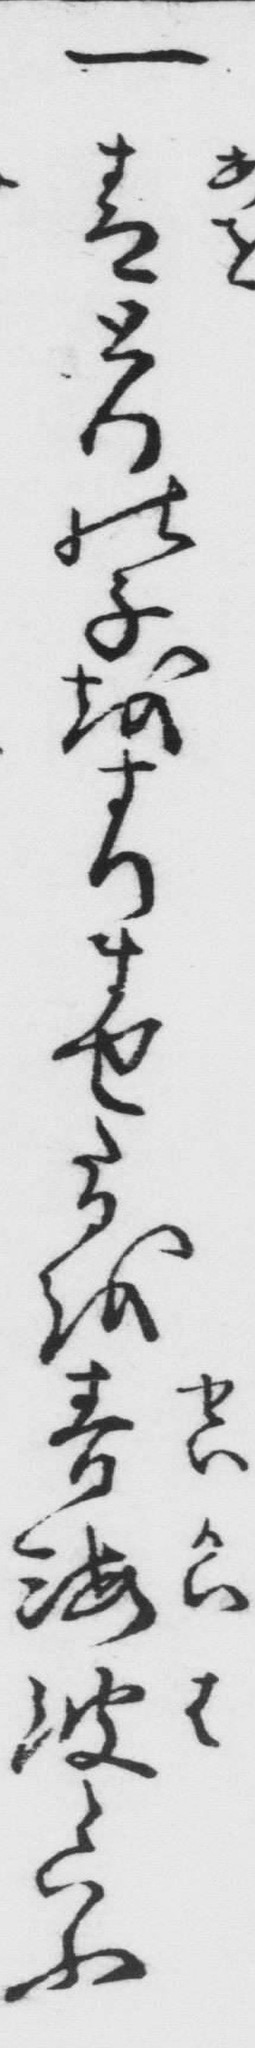一青とりの子をすりませたるを青海波といふ
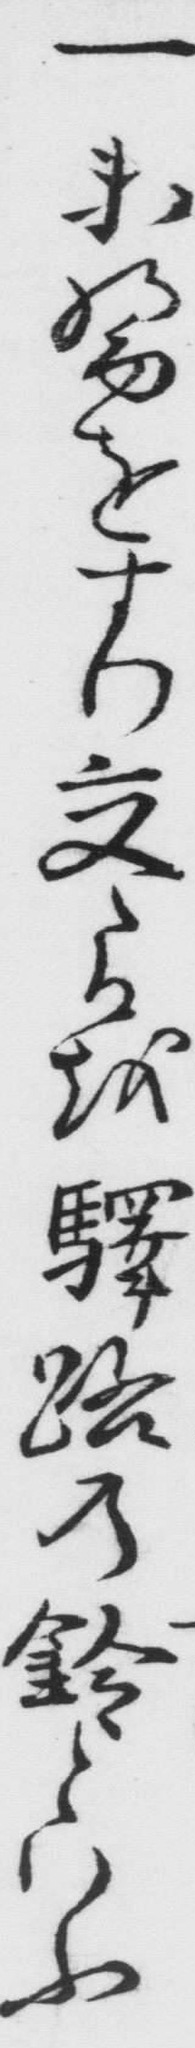一未醤をすり交たるを驛路の鈴といふ
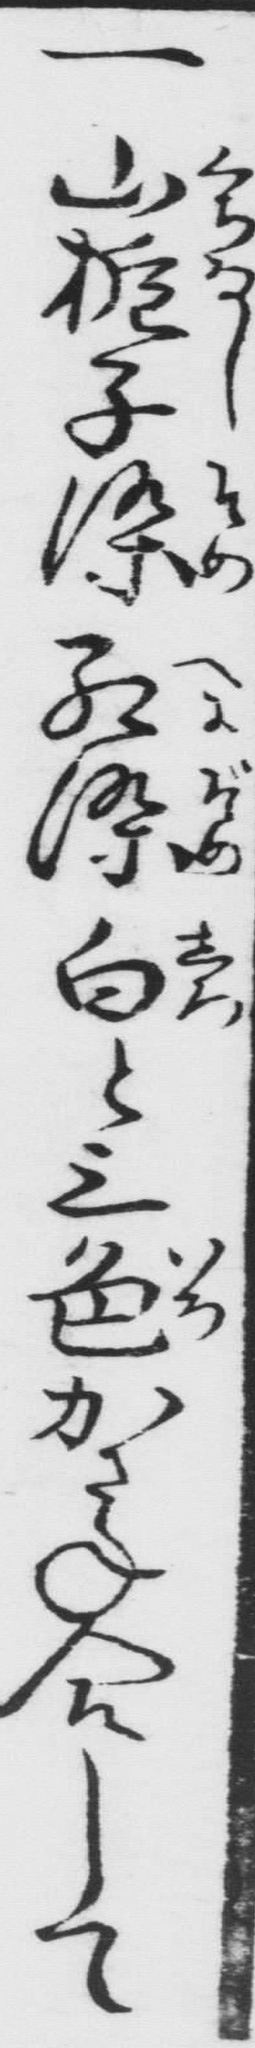一山梔子染紅染白と三色かさね合して
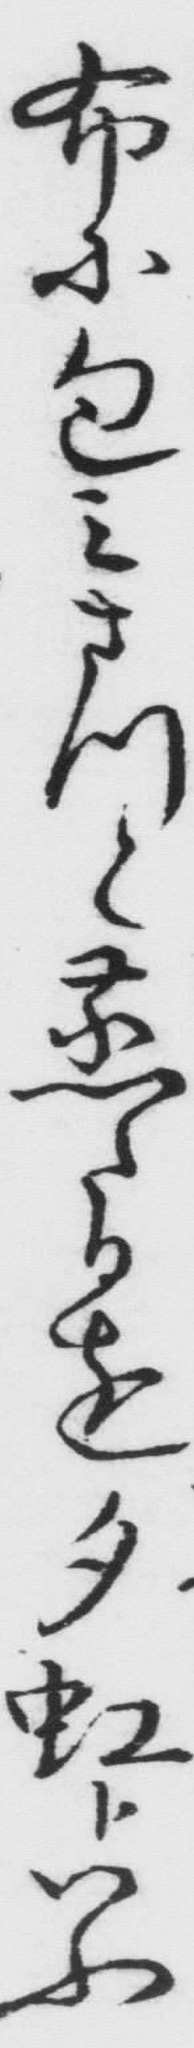布に包みさつと蒸たるを夕虹といふ
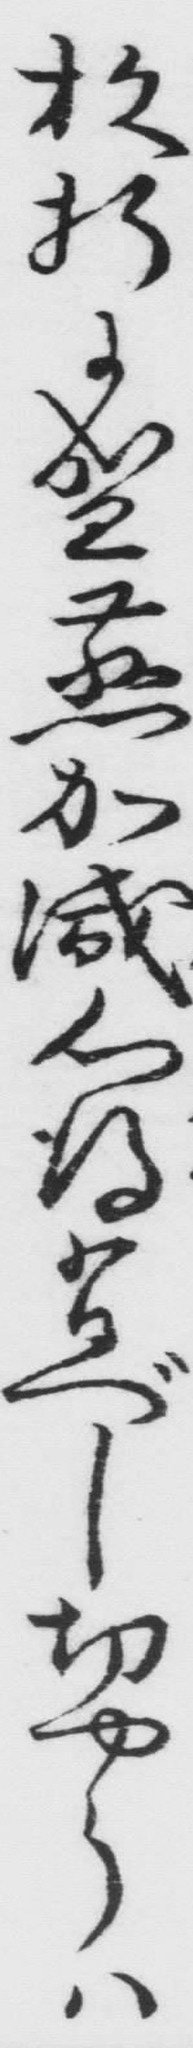杉折に盛蒸加減心得有べし切やうは
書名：海鰻百珍
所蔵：大阪府立大学学術情報センター 国文学研究資料館
